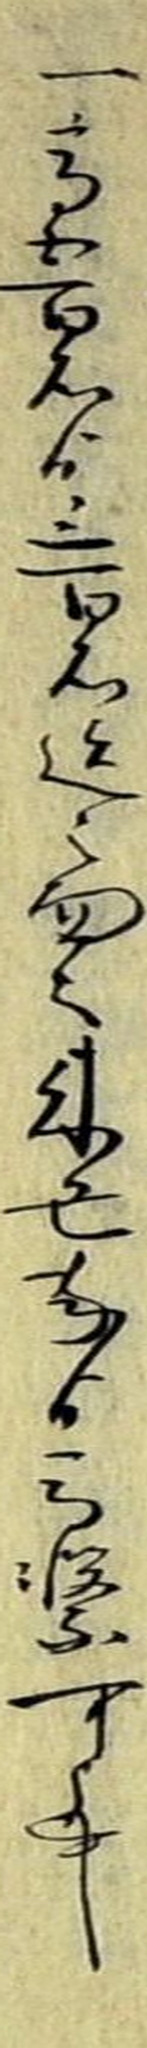一高五百石ゟ三百石迄之面々来丑年ゟ馬繋可申事
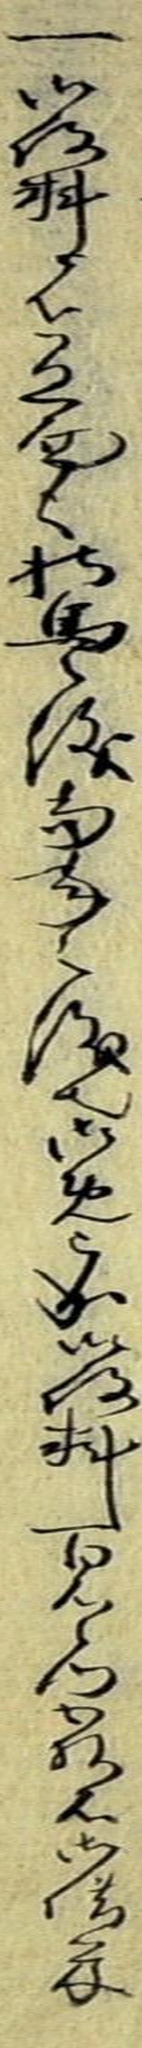一御役料被下置面々持馬之儀当年之儀は御免被成御役料百石之内五拾石御借米
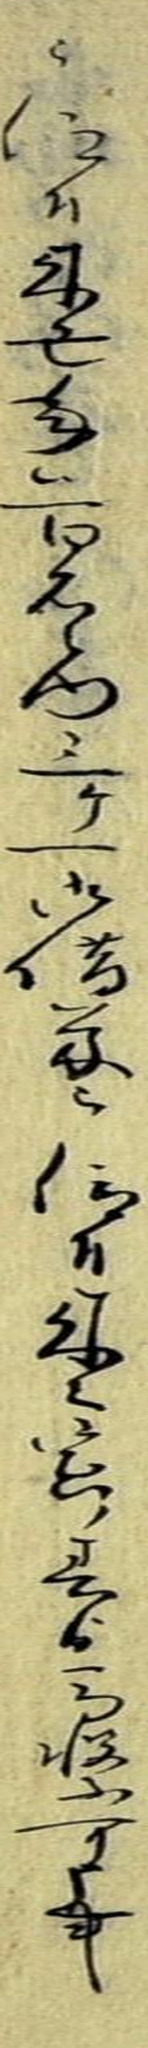被仰付来丑年は百石之内三ヶ一御借米被仰付来寅之春ゟ馬繋可申事
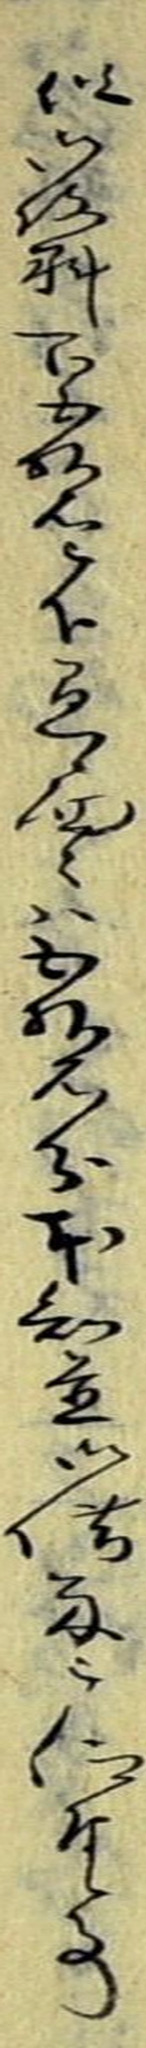但御役料百五拾石被下置候面々は五拾石分本知並御借米被仰付候事

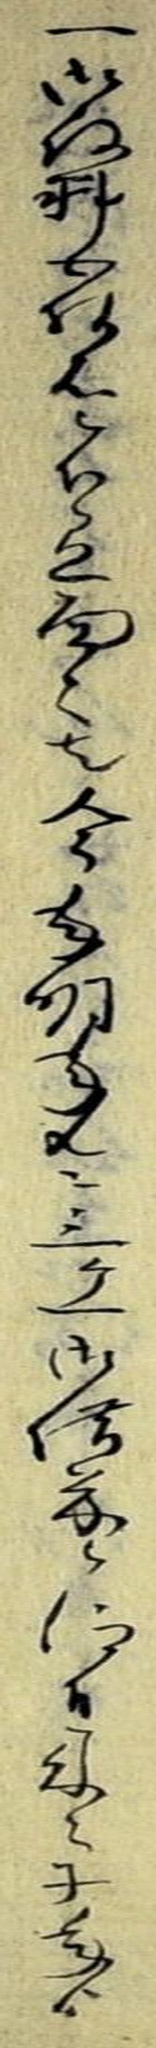一御役料五拾石被下置面々は今年明年共に三ヶ一御借米被仰付來々子年ゟ
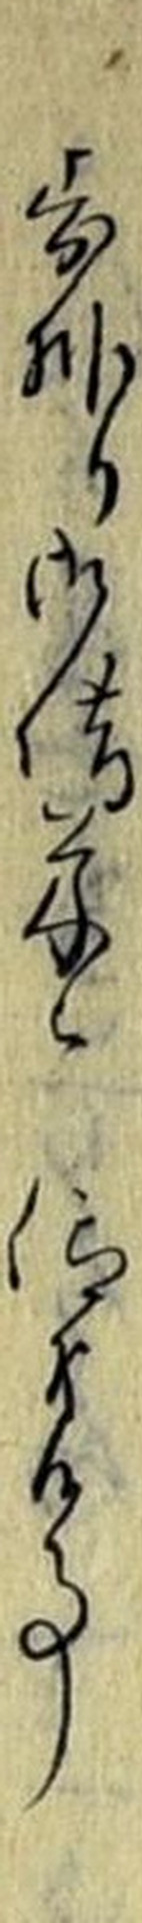歩掛り御借米被仰付候事
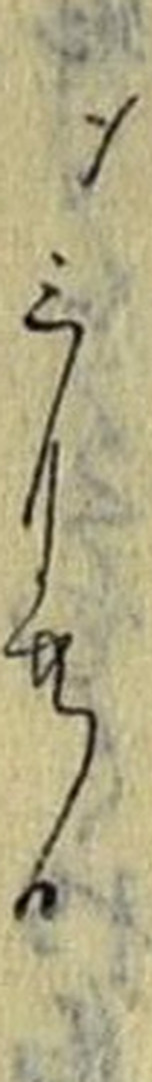〆三月廿日
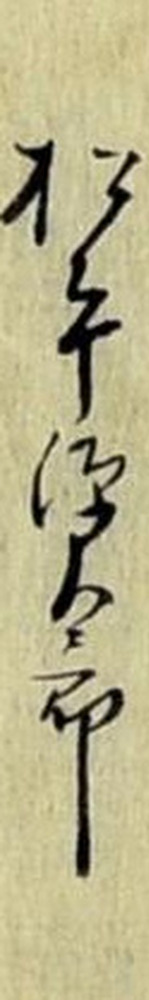松平源太郎
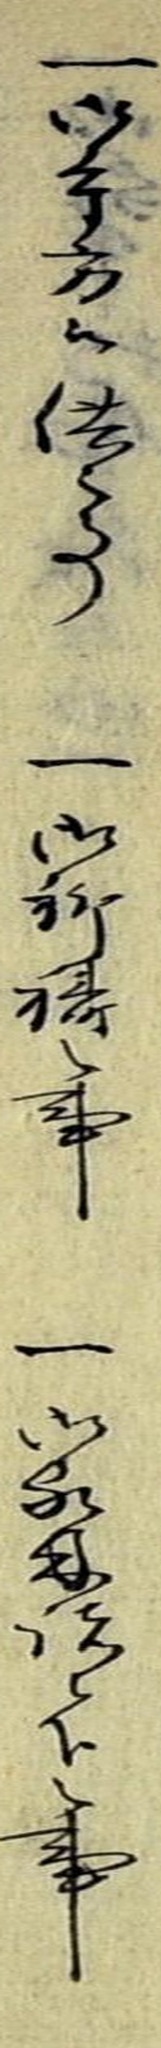一御寺方被供候事一御祈祷之事一御家来諸被下之事
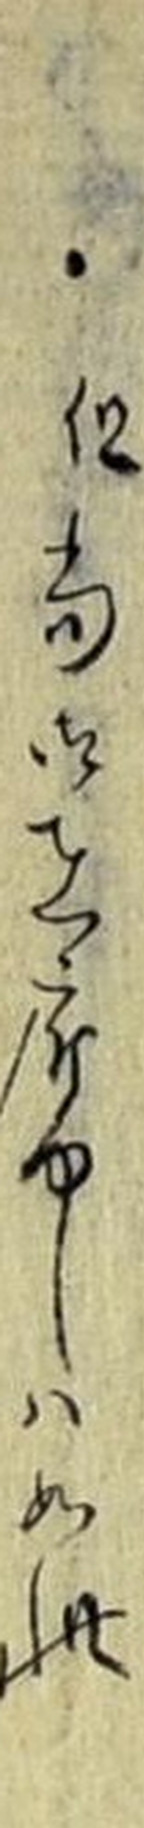但当御在府中は如此
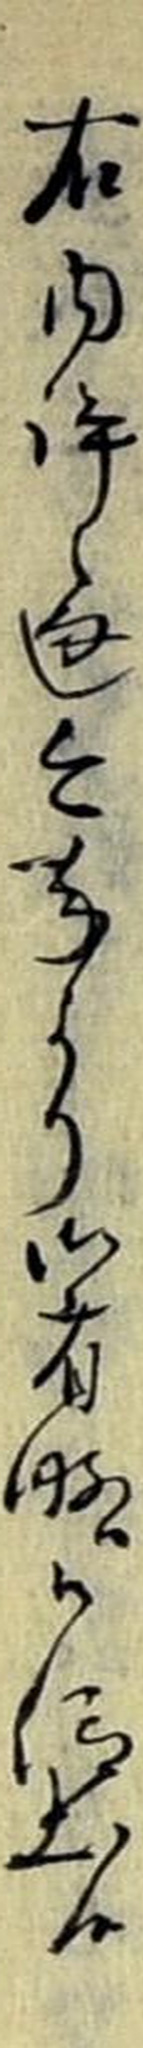右内評之通今年より御省略被仰出候
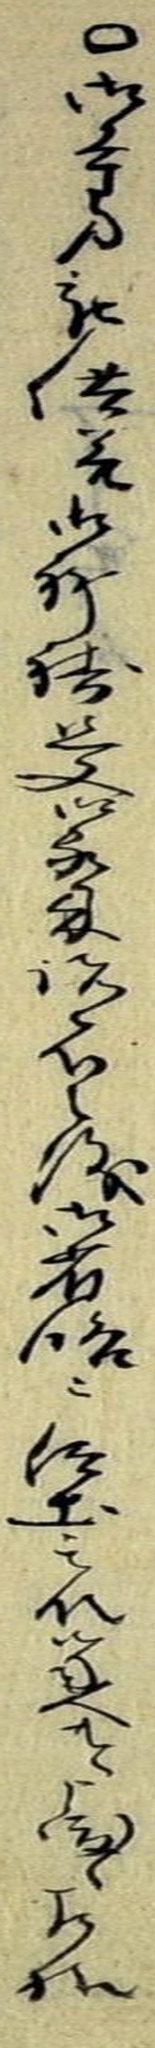○御寺方被供并御祈祷且又御家来諸被下之儀御省略被仰出其段御用人共へ申渡候左様
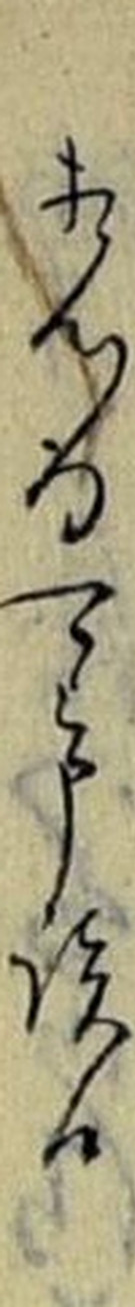相心得可被申談候
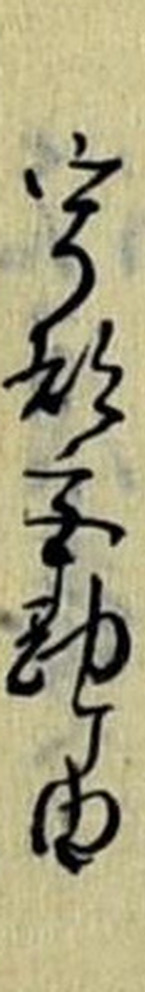宇都宮勘解由
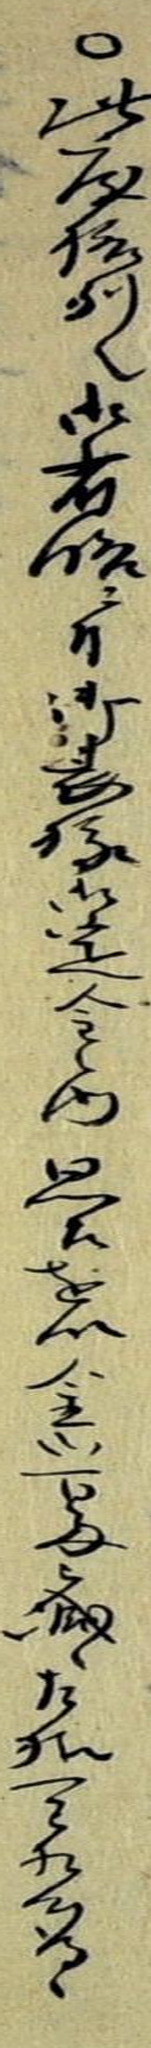○此度格別之御省略に付御表様御定金之内思召を以金弐百両被減候左様可被相心得候
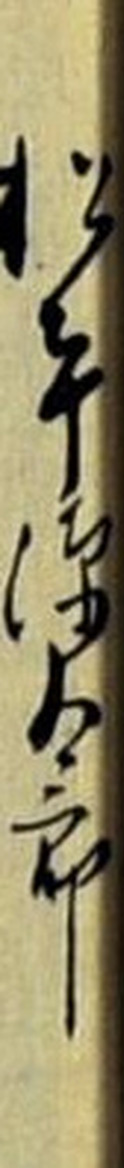松平源太郎
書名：命令之部 四
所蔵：福井県文書館 Fukui Prefectural Archives
